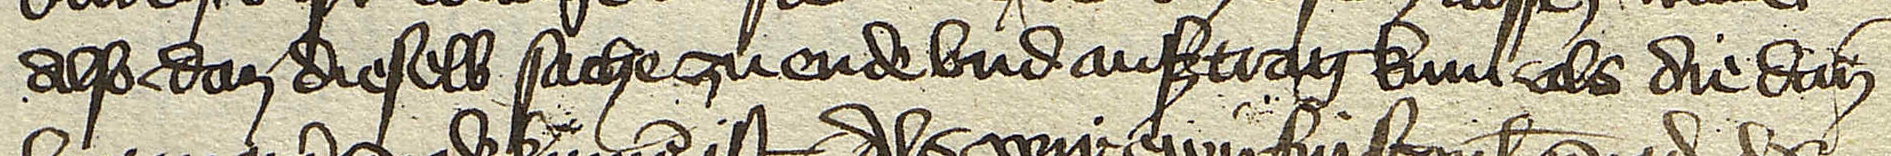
Alſo / dan dieſelb ſache cʒu ende vnd auſʒtrag kum / als die dan*
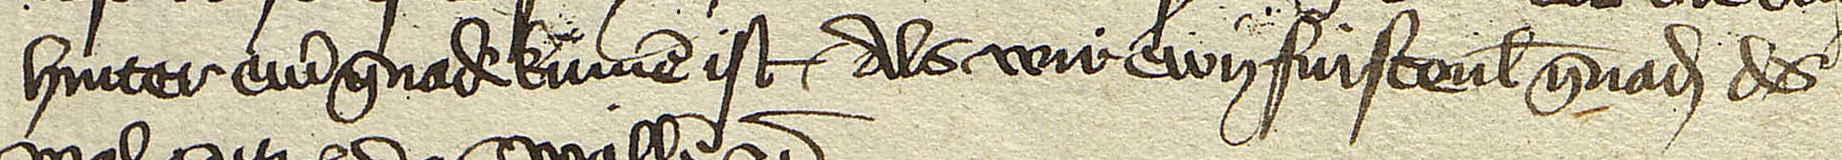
hinter ew* gnade küme* iſt / Als wir ewn fürſtenl* gnad* des
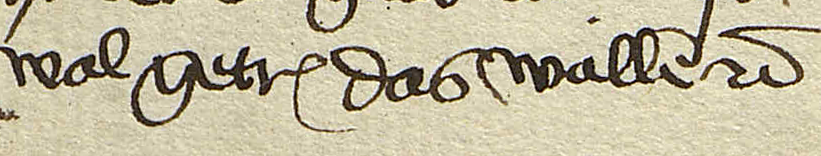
wol getr* das wölle* ec*
